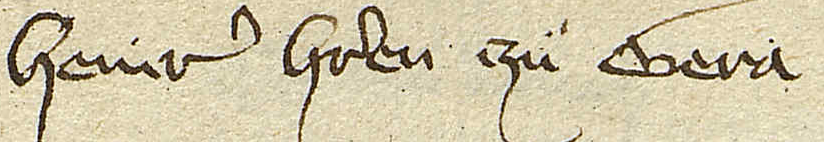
heinr* hr*en cʒü Gera
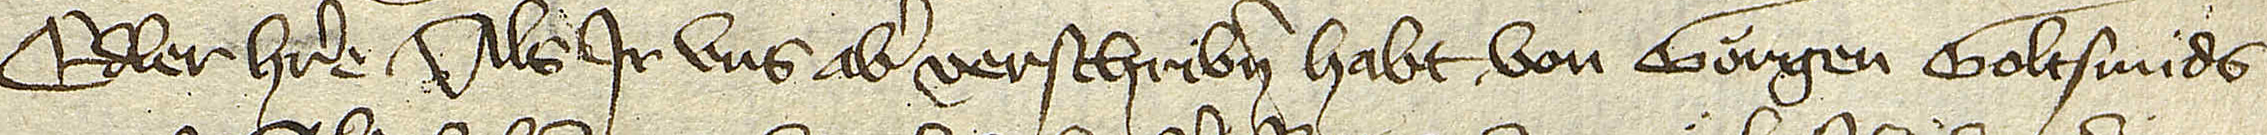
Edler hr*e / Als Ir vns verſchribn* habt / von Görgen Goltſmids
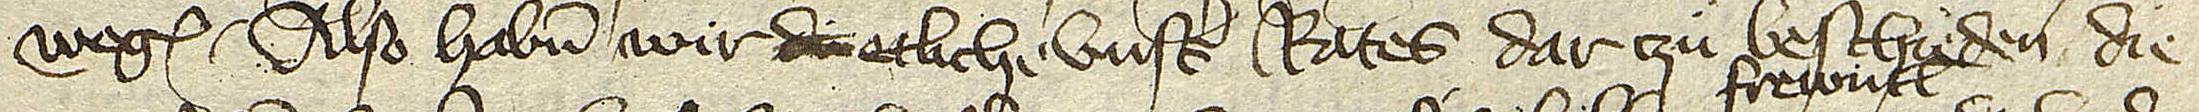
weg* / Alſo habn* wir die etliche vnſs* Rates dar cʒü beſchieden die
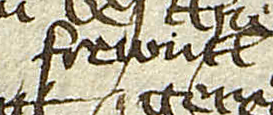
frewntl*
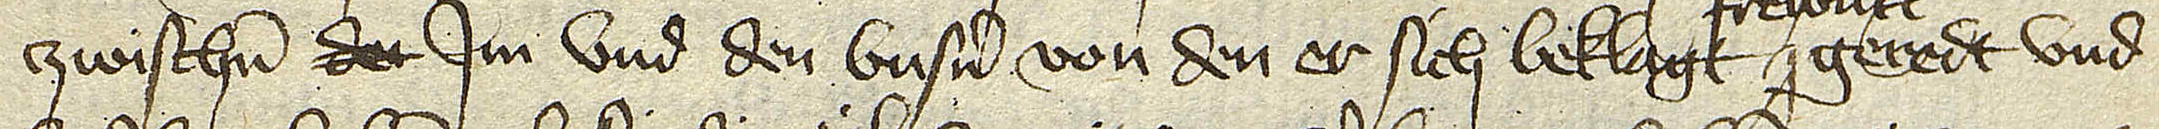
cʒwiſchn* der Im vnd den vnſn* von den er ſich beklagt / geredt vnd
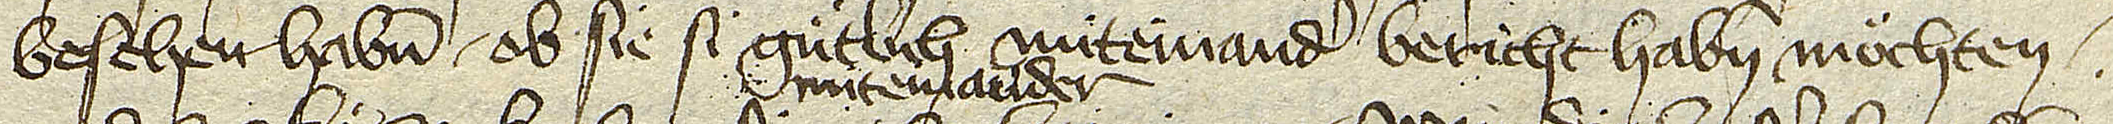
beſehen habn* / ob ſie ſi gütlich miteinand* bericht habn* möchten / .
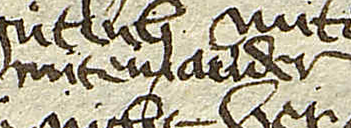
miteinander
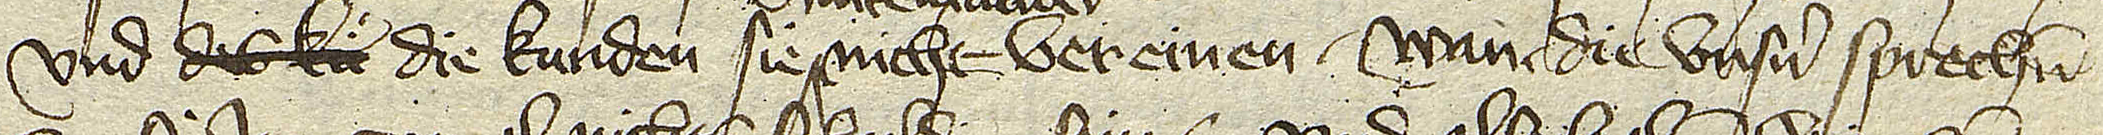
vnd des kü die kunden ſie nicht vereinen / wan / die vnſn* ſprechn*
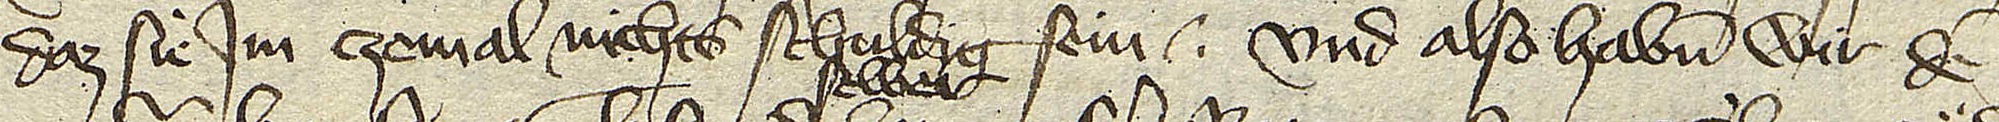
daʒ ſie Im cʒemal nichts ſchuldig ſein / . vnd alſo habn* wir d*
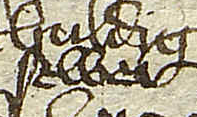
ſelber
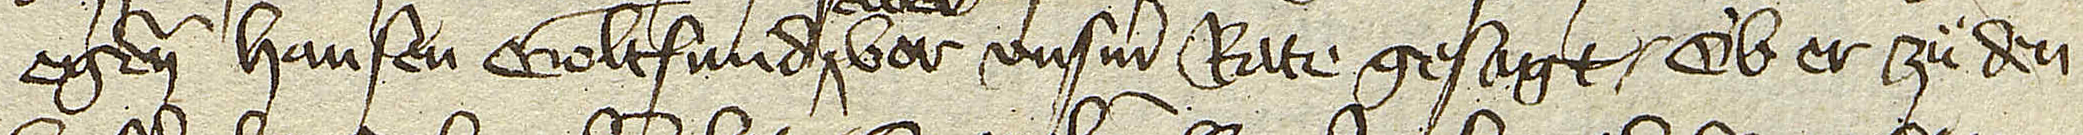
egen* hanſen Goltſmid vor vnſm* Rate geſagt / Ob er cʒü den
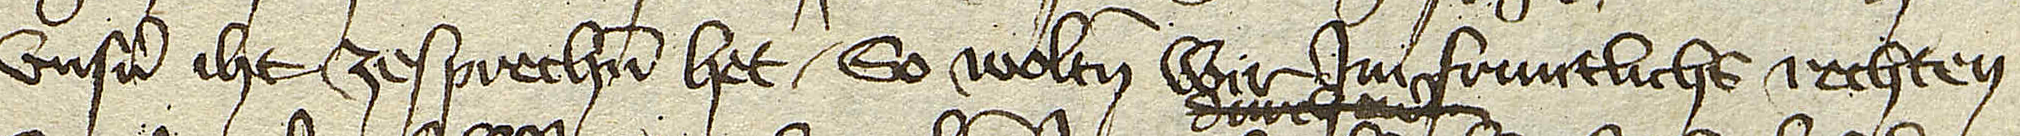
vnſn* iht cʒeſprechn* het / So woltn* wir Im fruntlichs rechten
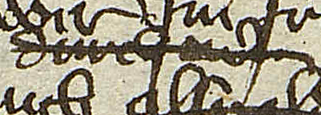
durch ew*
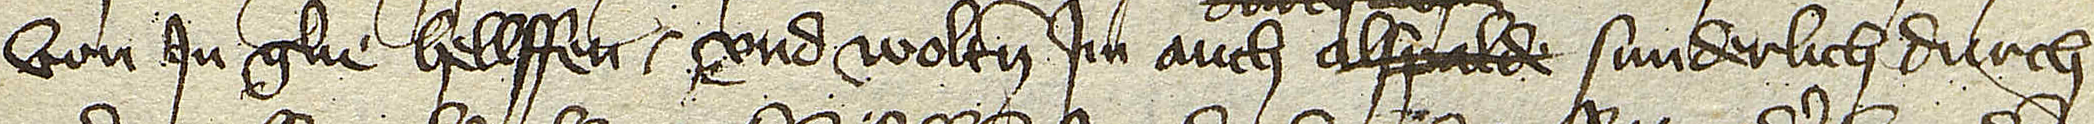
von In g*ne hellffen / vnd woltn* Im auch alſpalde ſunderlich durch
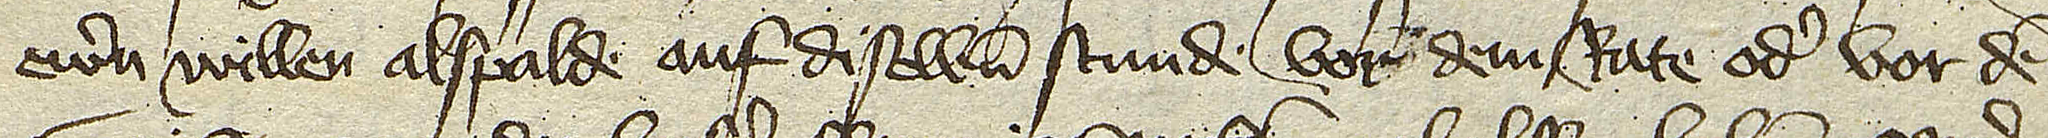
ew*n willen alſpalde auf diſelbn* ſtunde vor dem Rate od* vor d*
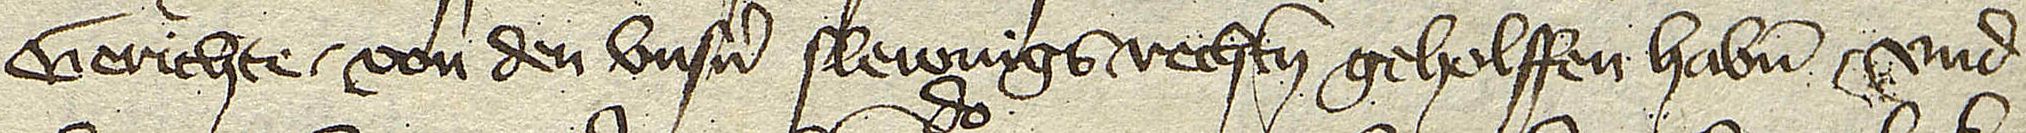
Gerichte / von den vnſn* ſlewnigs rechtn* geholffen habn* / vnd
